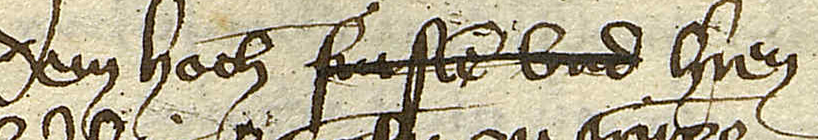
Dem hoch* fürſte* vnd h*ren
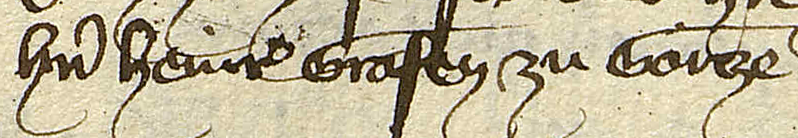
hn* heinr* Grafen cʒu Görcʒe
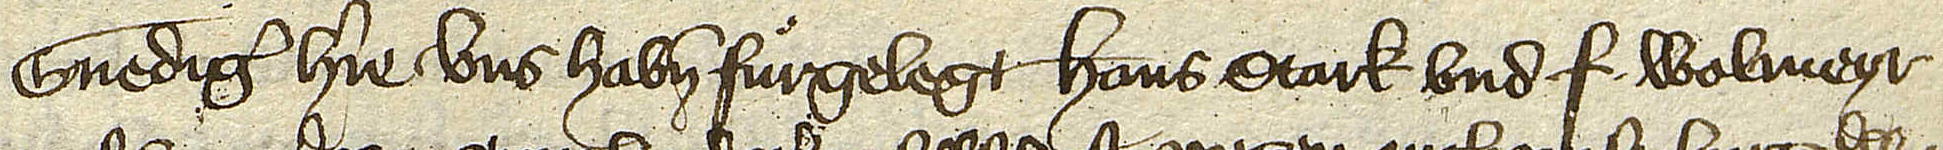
Gnedig* h*re / vns habn* fürgelegt Hans Stark vnd f. wolmeyr
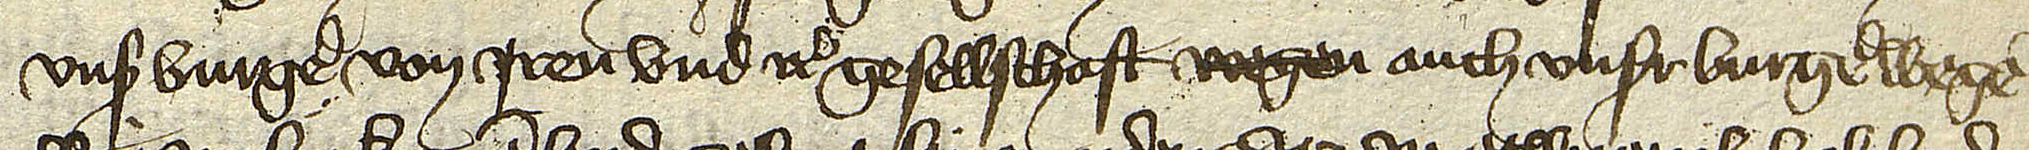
vnſ* burge* von Iren vnd ir* geſellſchaft wegen auch vnſ*r burge* wege*
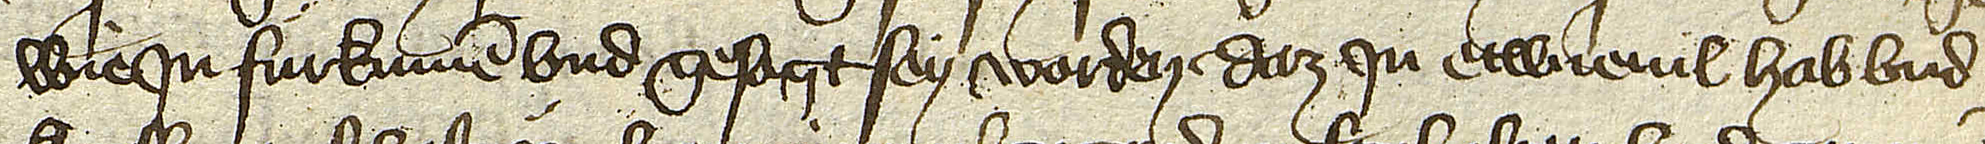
wie In fürkume* vnd geſagt ſey worden / daʒ In etwieuil hab vnd
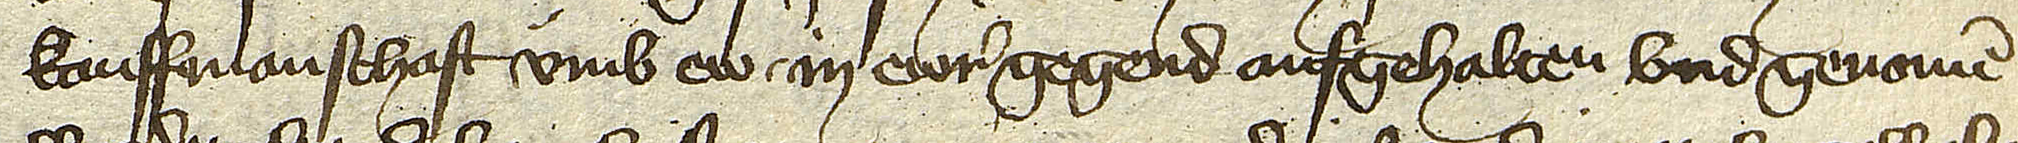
kauffmanſchaft v̈mb ew / in ewr* gegend aufgehalten vnd genome*
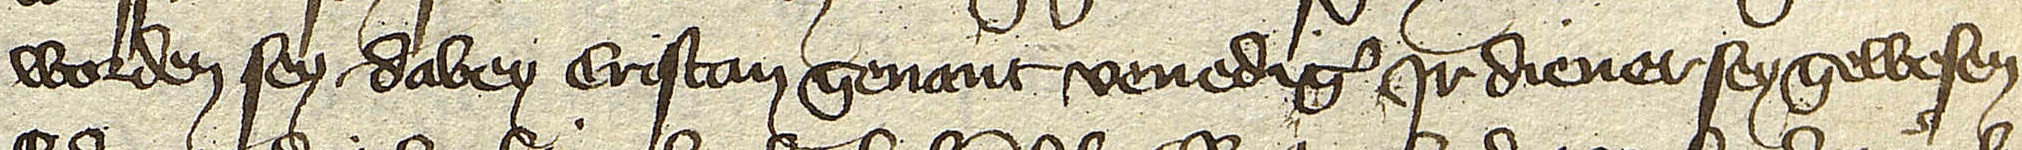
worden ſey / dabey Criſtan genant venedig* Ir diener ſey geweſen
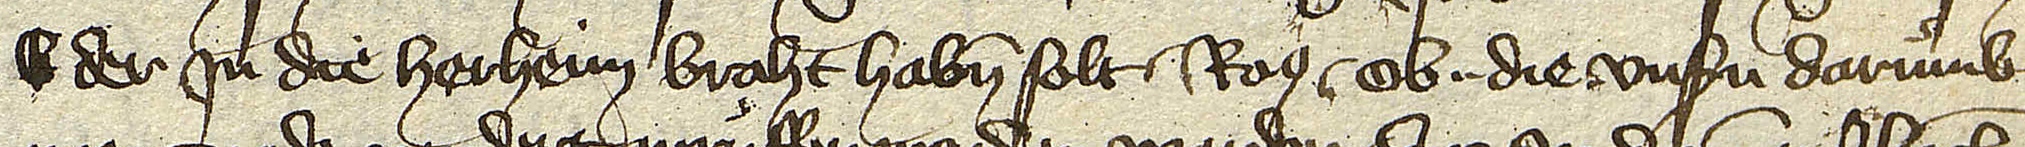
w der In die herheim braht habn* ſolt / Ro* / Ob ~ die vnſ*n darümb
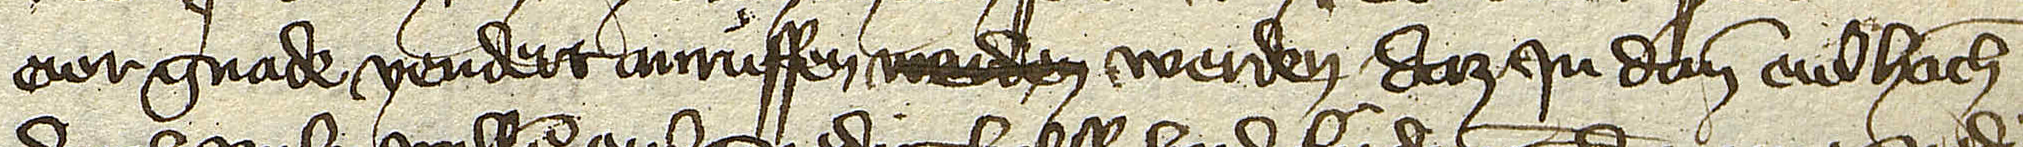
ewr gnade yendert anrüffen werden werden / daʒ In dan* ew* hoch*
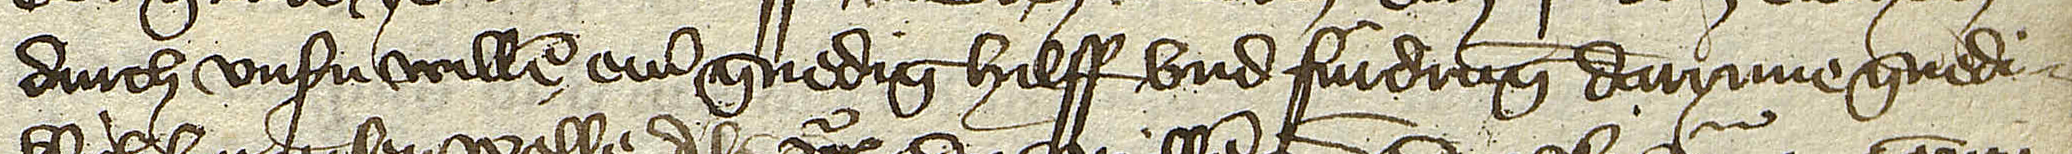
durch vnſ*n wille* ew* gnedig hilff vnd fürdrug* darynne gnedi =
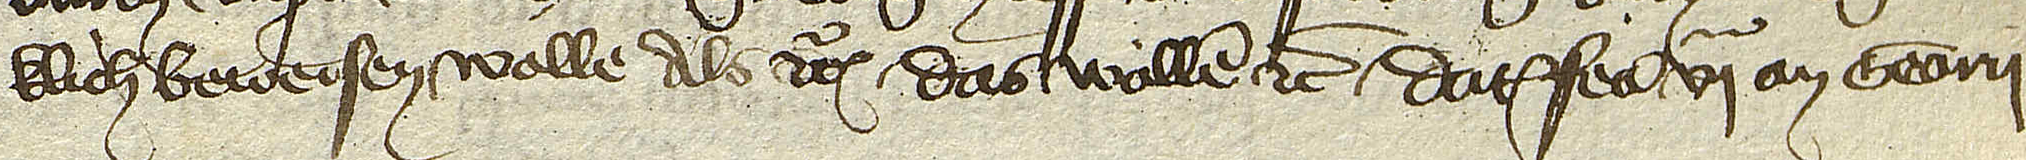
klich beweiſen wölle Als ec* / das wölle* ec* / Dat* fea* vi* an Georii*
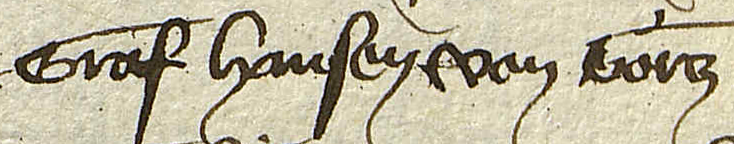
Graf Hanſen von Görcʒ*
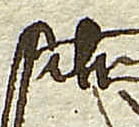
ſilr*
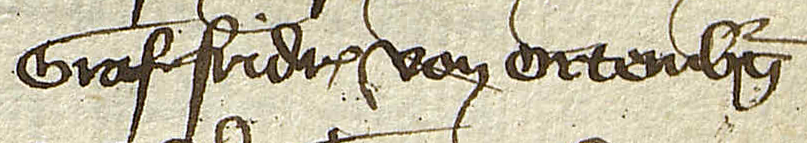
Graf fridr* von Ortemb*g
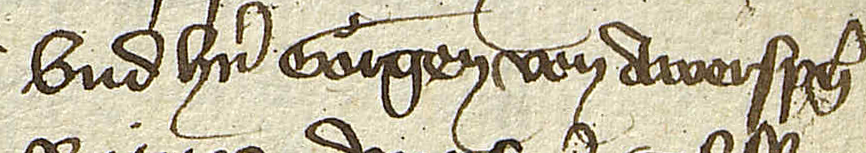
vnd hn* Görgen von Awerſp*g
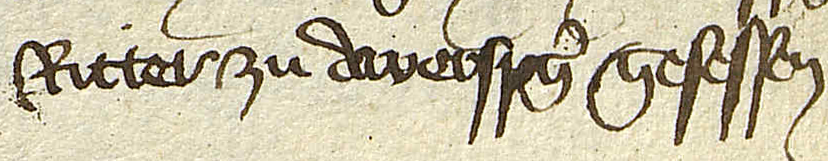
Ritter cʒu Awerſpg* geſeſſen
